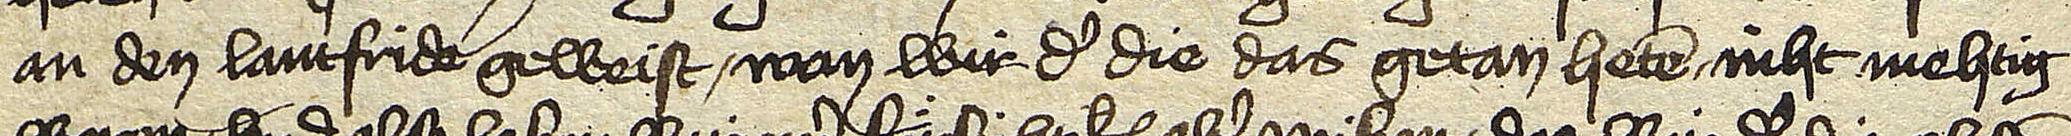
an den lantfride geweiſt / wan wir d* die das getan hete* / niht mehtig
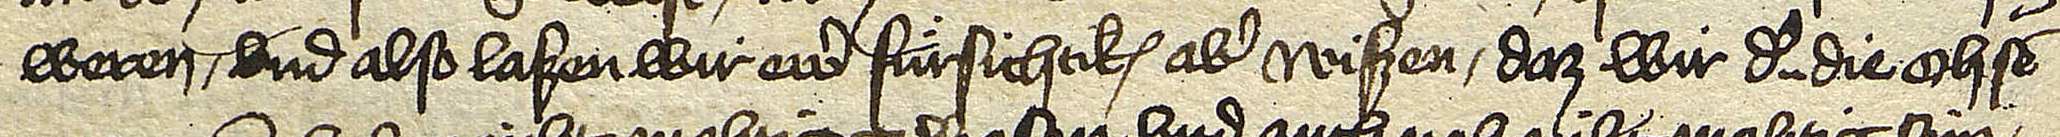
weren / vnd alſo laſʒen wir ew* fürſichtik* ab* wiſʒen / daʒ wir d* ~ die Ohſe*
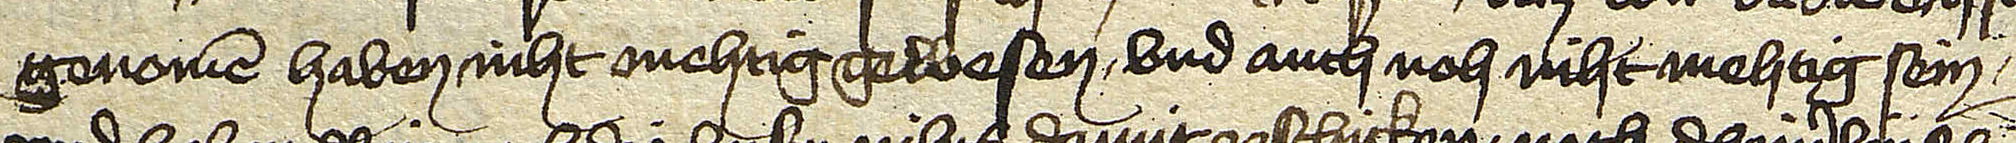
genome* haben niht mehtig geweſen / vnd auch noh niht mehtig ſein /
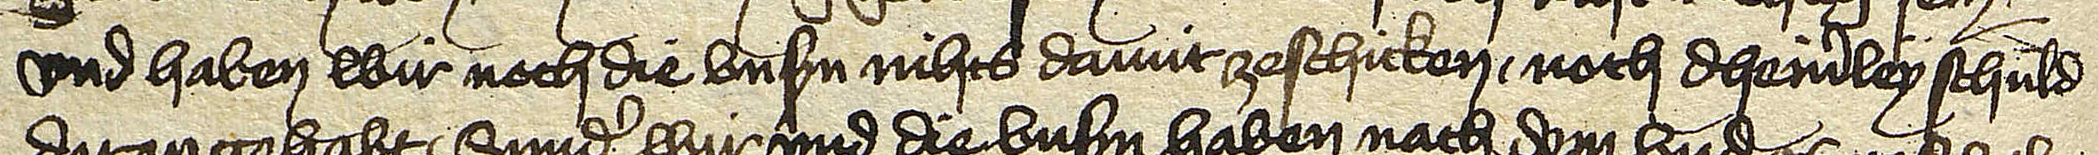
vnd haben wir noch die vnſ*n nihts damit cʒeſchicken / noch dhein*ley ſchuld
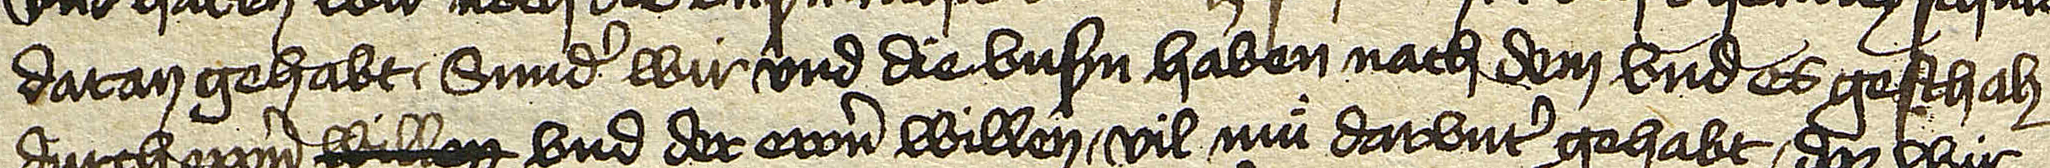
daran gehabt / Sund* wie vnd die vnſ*n haben nach dem vnd es geſchah
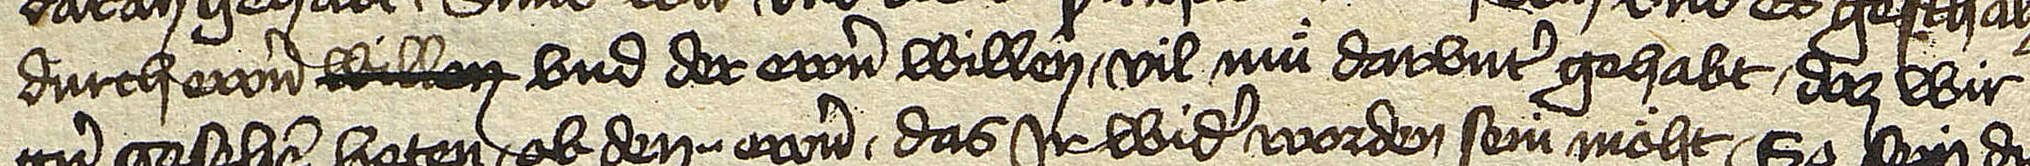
durch ewn* willen vnd der ewn* willen / vil mü darvnt* gehabt / daʒ wir
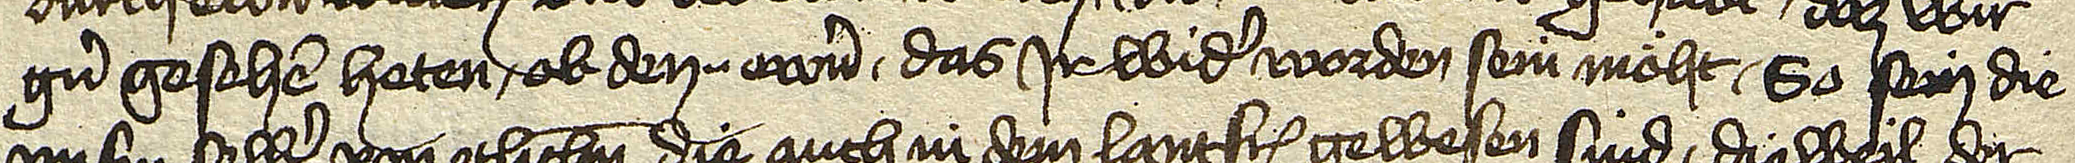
gn* geſehe* heten / ob den ~ ewn* / das Ir wid* worden ſein möht / So ſein die
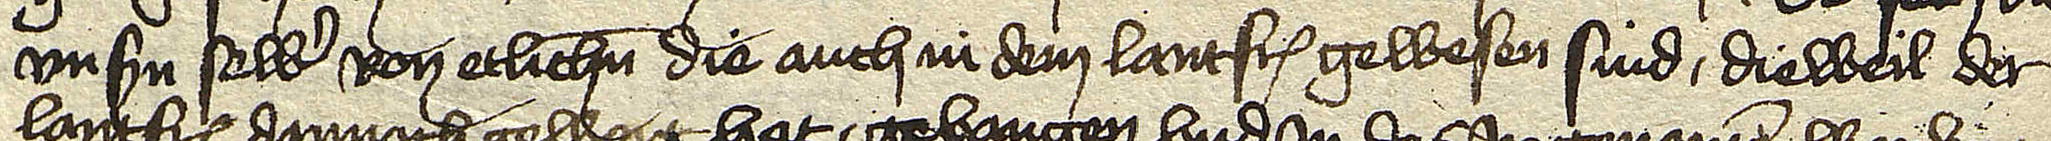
vnſ*n ſelb* von etlichn* die auch in dem lantfr* geweſen ſind / dieweil der
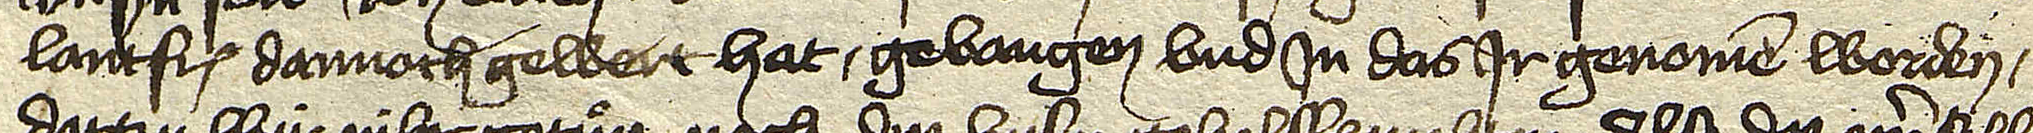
lantfr* darnoch gewert hat / gevangen vnd In das Ir genome* worden /
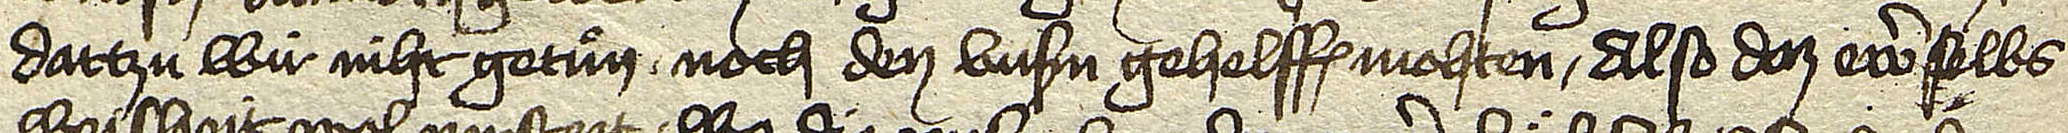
darcʒu wir niht getün noch den vnſ*n gehelff* mohten / Alſo daʒ ew* ſelbs
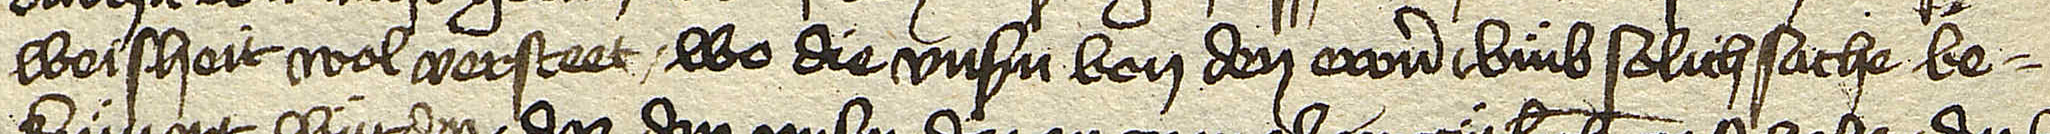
weiſheit wol verſteet / wo die vnſ*n von den ewn* / v̈mb ſolich ſache be =
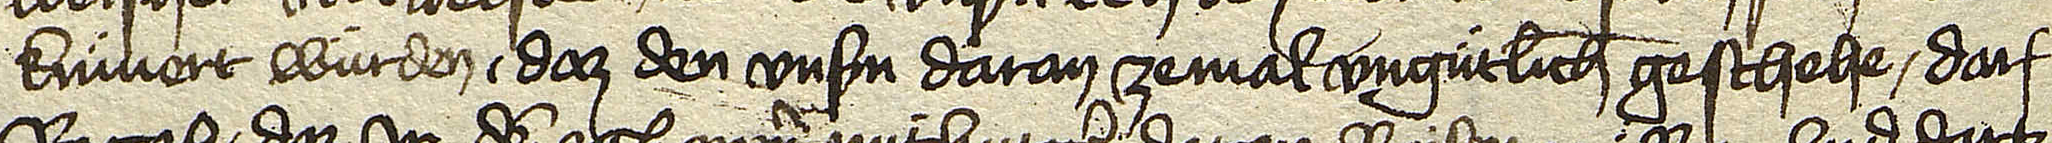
kümert würden / daʒ den vnſ*n daran cʒemal vngütlich* geſchehe / dar*
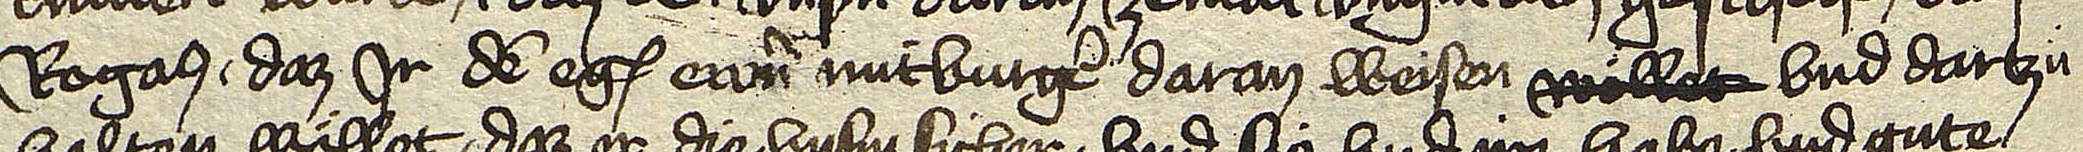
Roga* / daʒ Ir de* eg* ewn* mitburg* daran weiſen wöllet vnd dartʒü
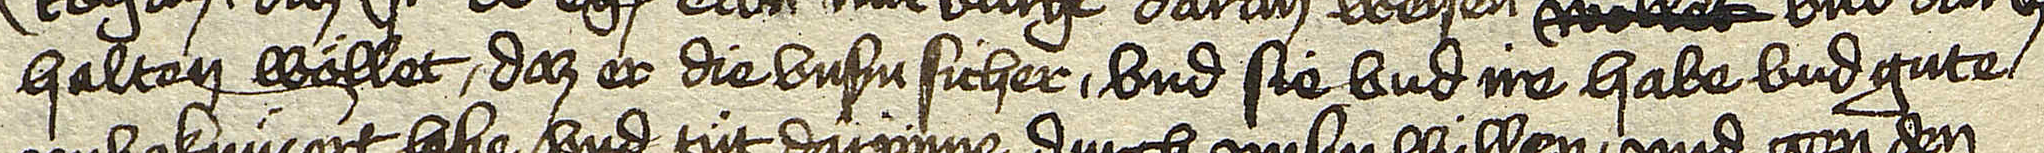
halten wöllet / daʒ er die vnſ*n ſicher / vnd ſie vnd ire habe vnd gute /
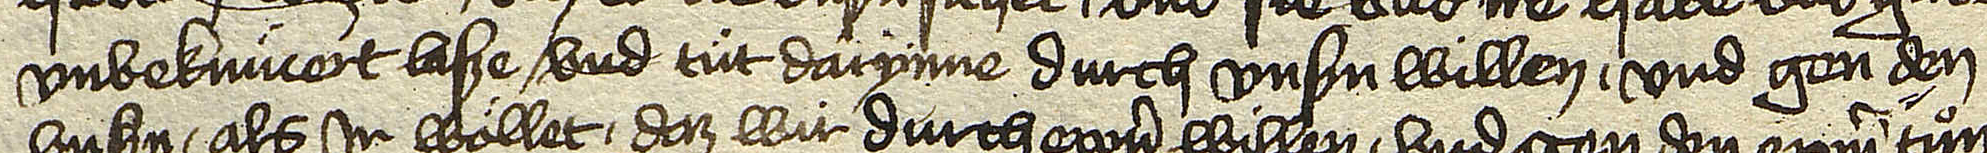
vnbekümert laſʒe / vnd tüt darynne durch vnſ*n willen / vnd gen den
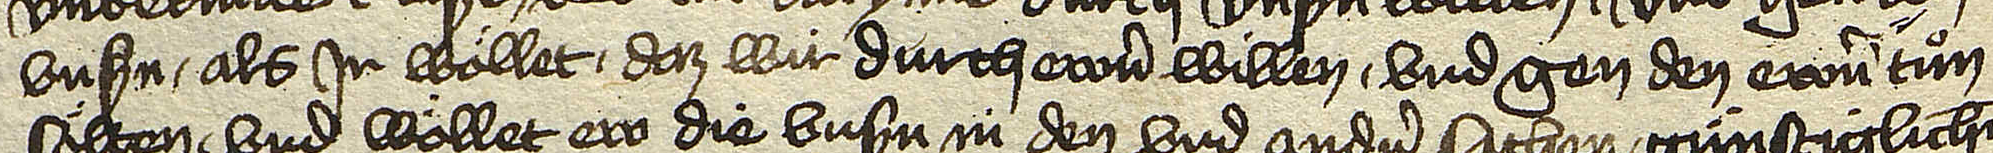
vnſ*n / als Ir wöllet / daʒ wir durch ewn* willen / vnd gen den ewn* tün
